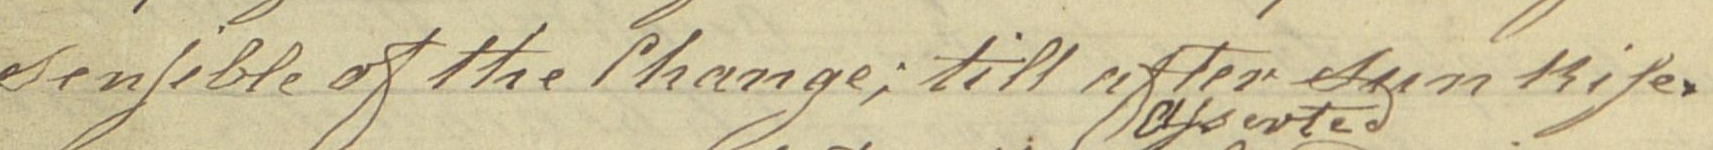sensible of the Change; till after sun Rise,
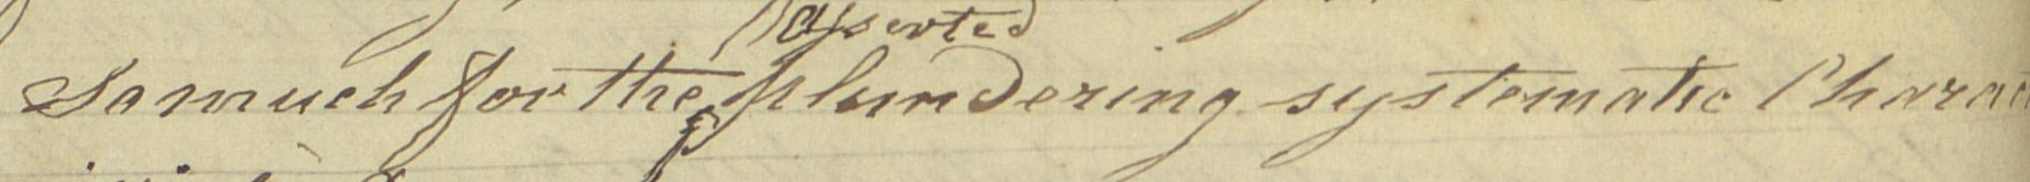so much for the plundering systematic Charac-
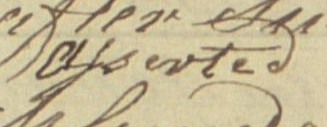asserted
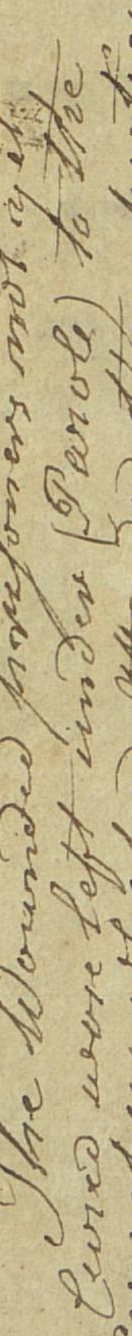cured were left under (Parole) to the
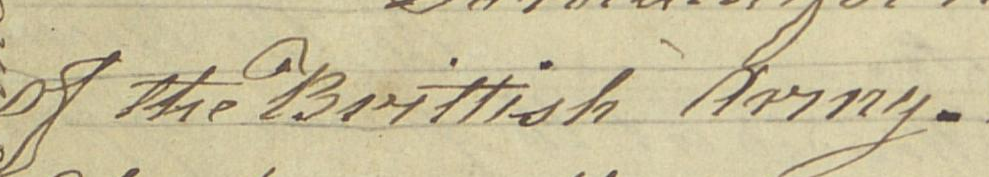of the Brittish Army.
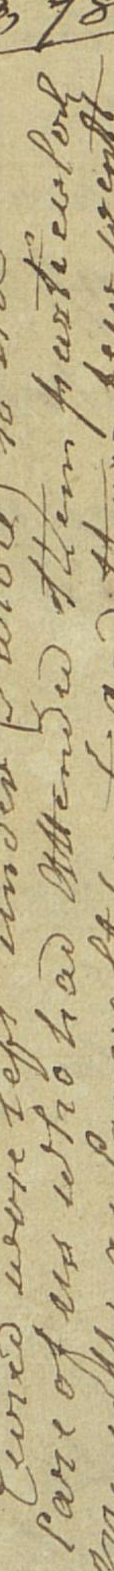Care of us who had Attended them particular
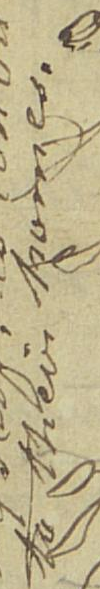to their homes.
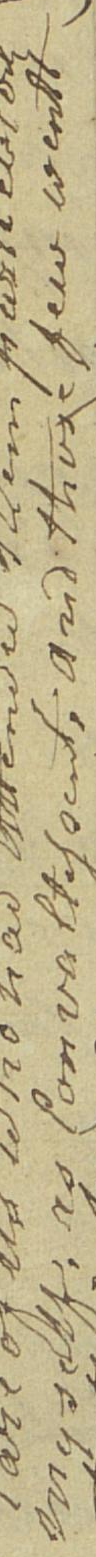myself, as Convallescent; and those few went
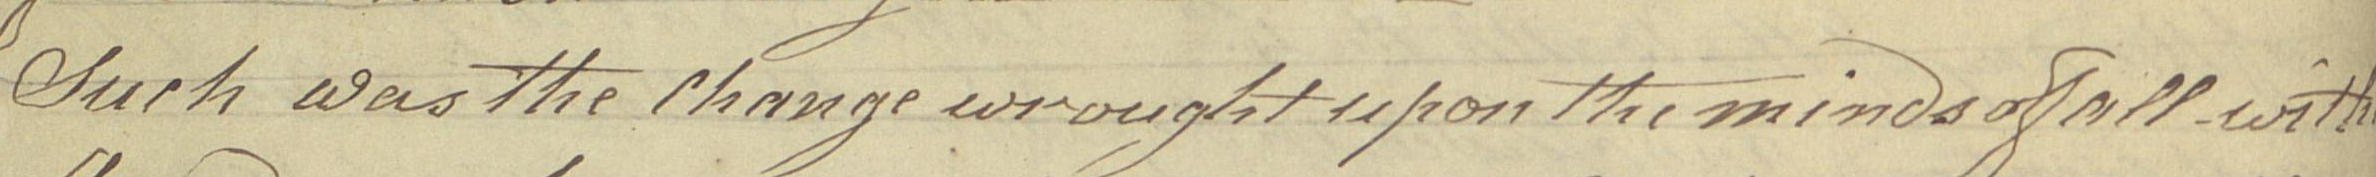Such was the Change wrought upon the minds of all with-
